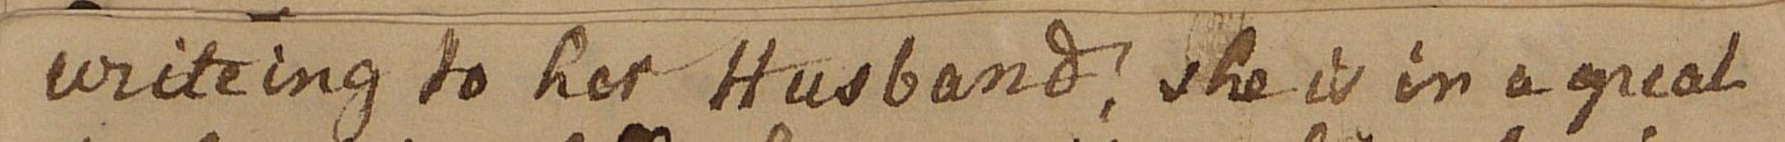writeing to her Husband, she is in a great
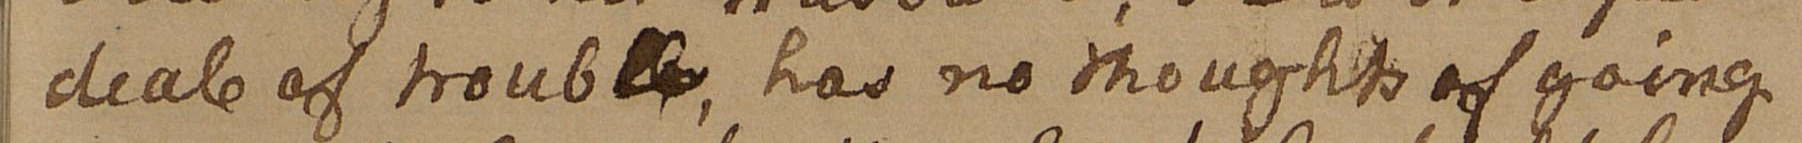deal of trouble, has no thoughts of going
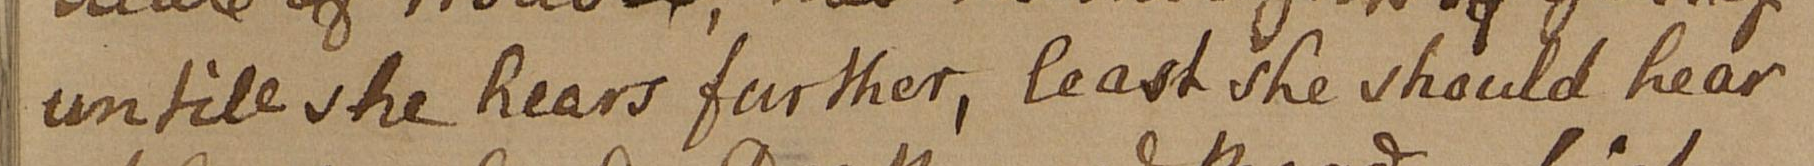untill she hears further, least she should hear
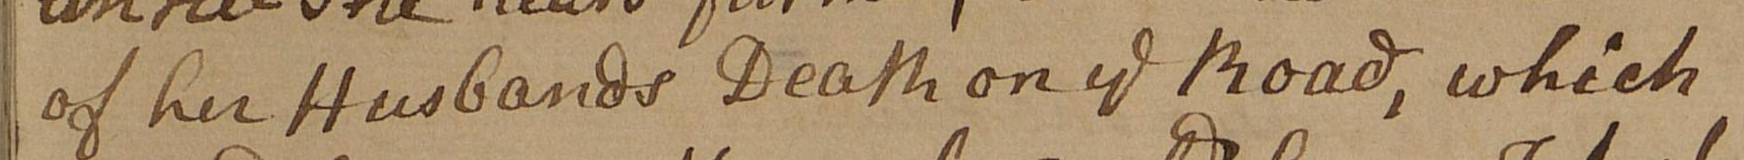of her Husbands Death on y^e Road, which
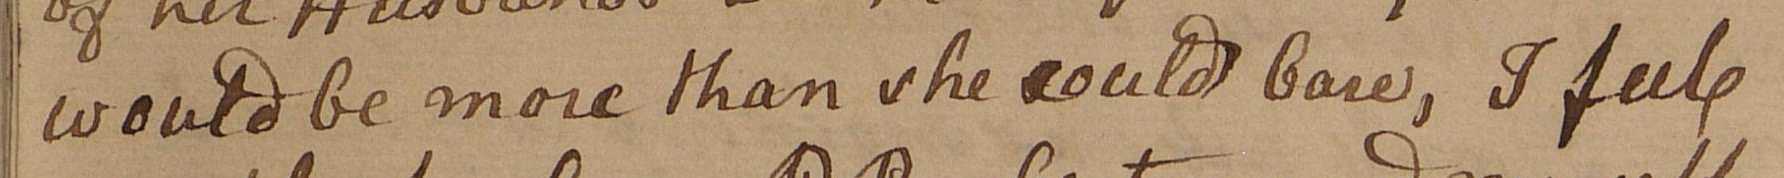would be more than she could bare, I feel
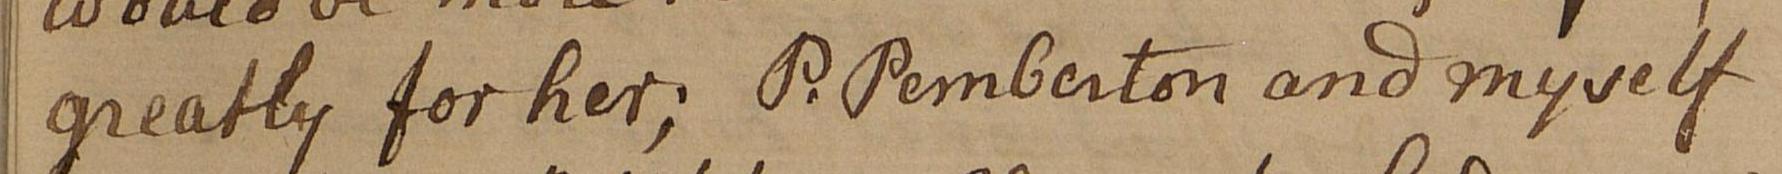greatly for her; P. Pemberton and myself
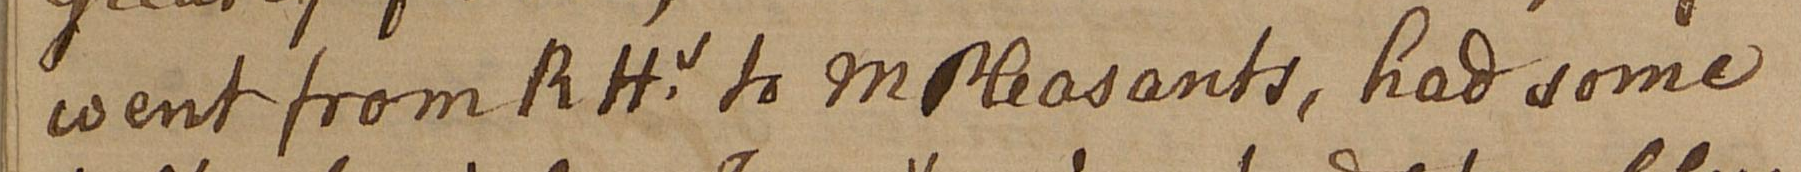went from RH^s. to M Pleasants, had some
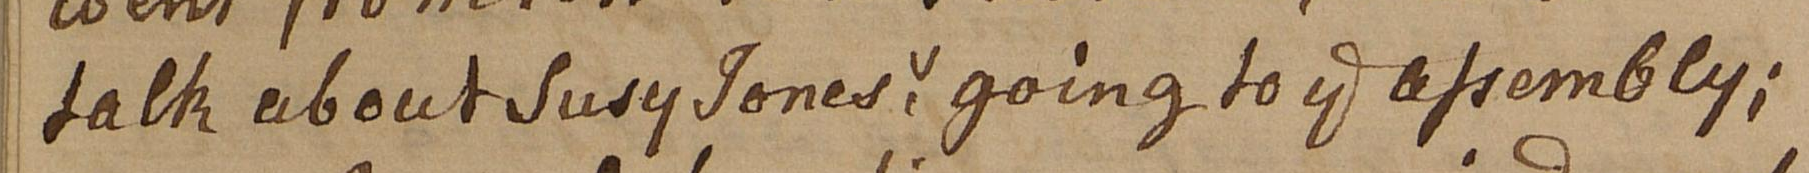talk about Susy Jones^s. going to y^e assembly;
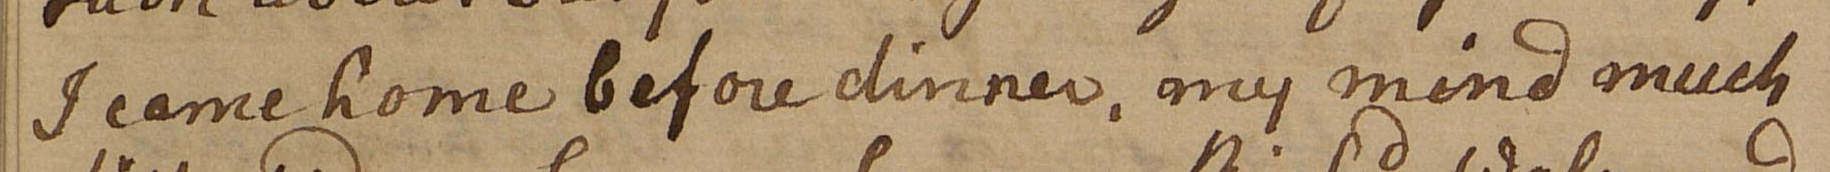I came home before dinner, my mind much
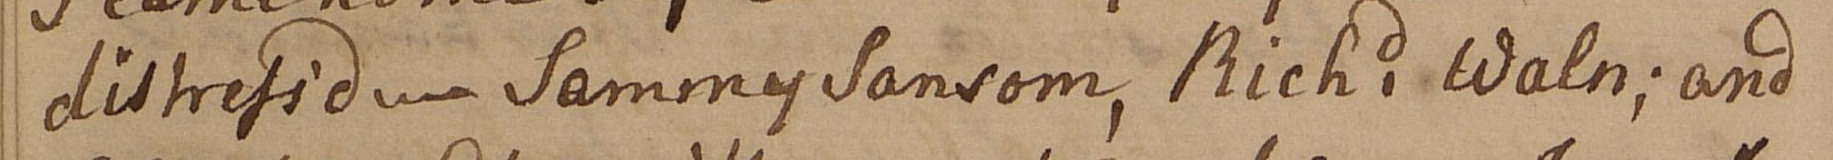distress'd- Sammy Sansom, Rich^d. Waln; and
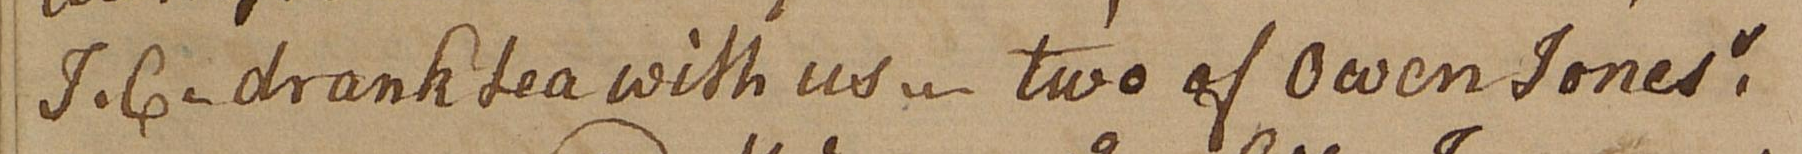J.C- drank tea with us- two of Owen Jones^s.
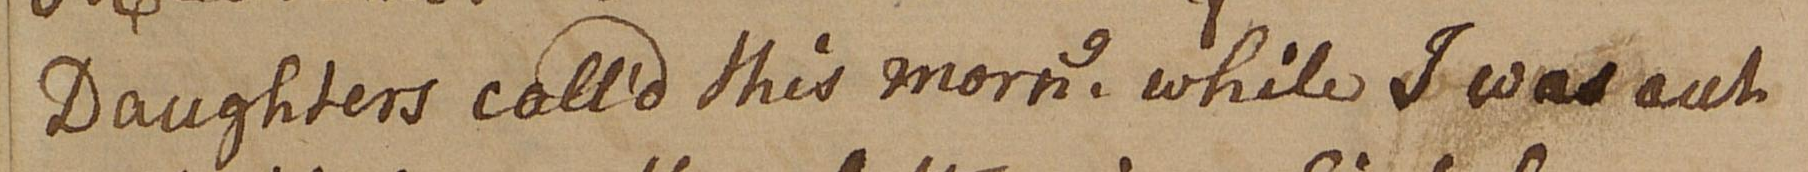Daughters call'd this morn^g. while I was out
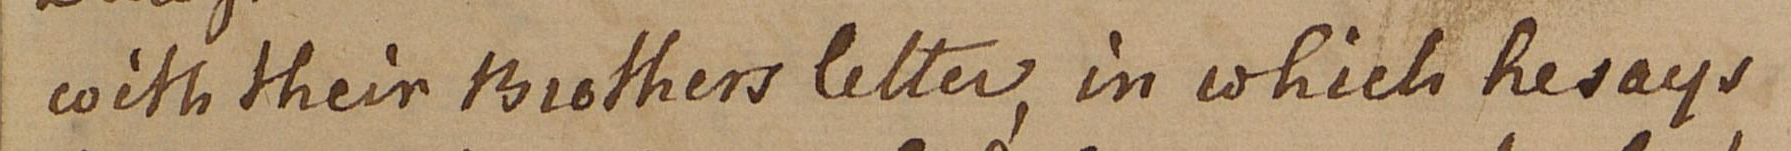with their Brothers letter, in which he says
